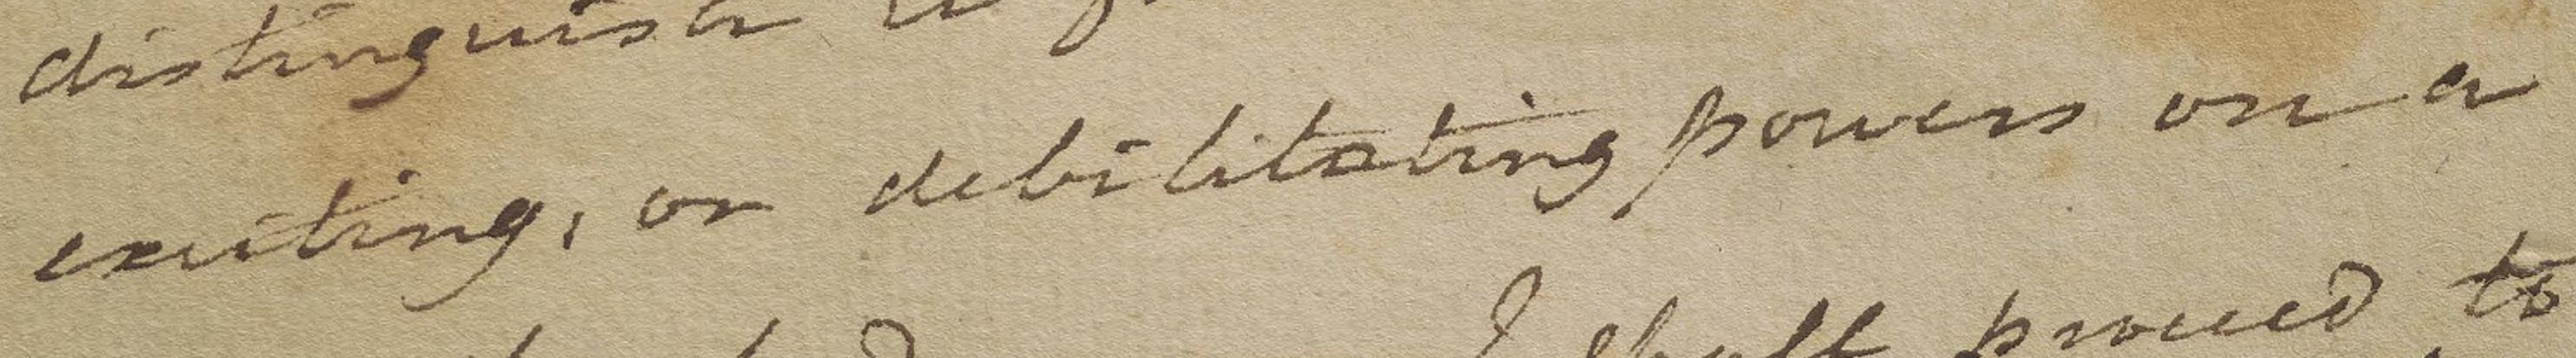exciting, or debilitating powers on a
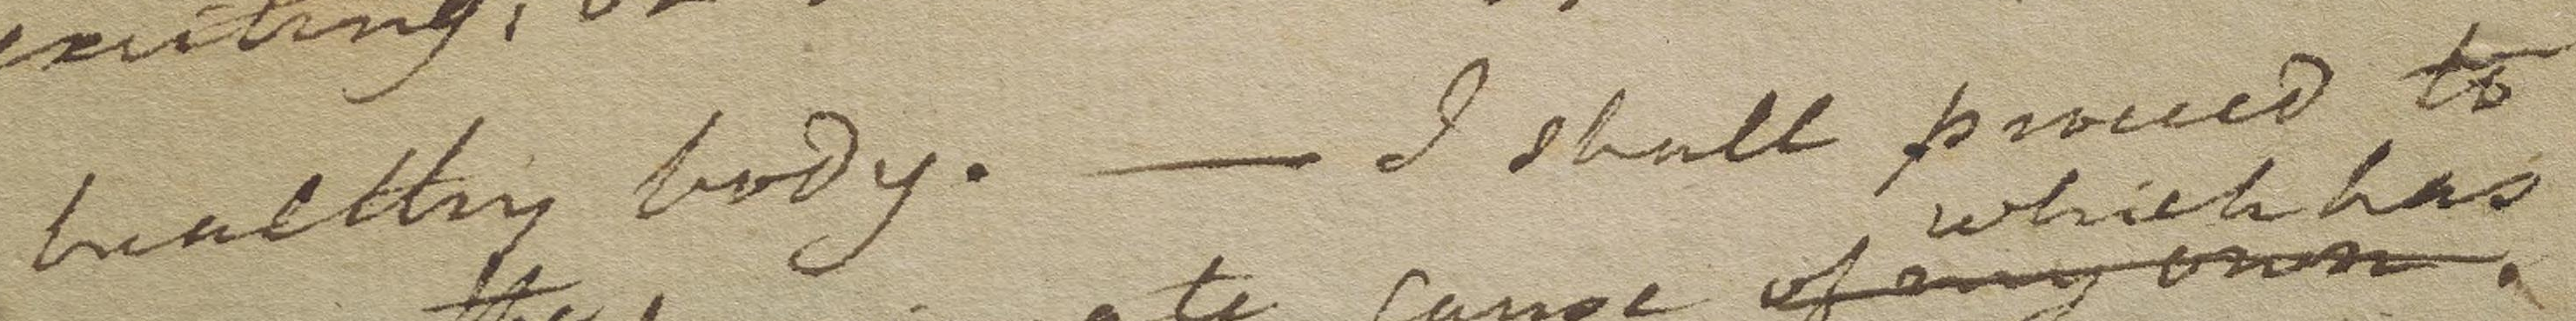healthy body. I shall proceed to
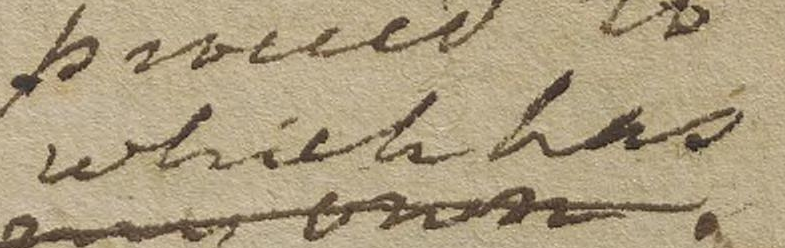which has
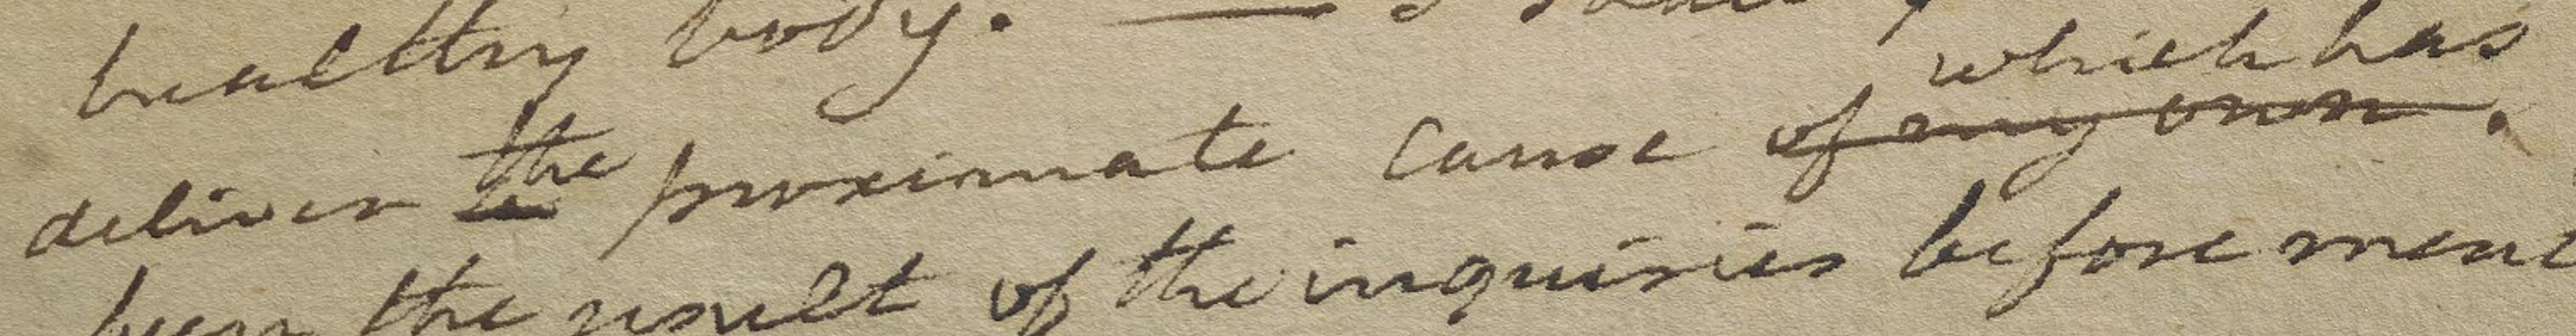deliver the proximate cause [of my own]
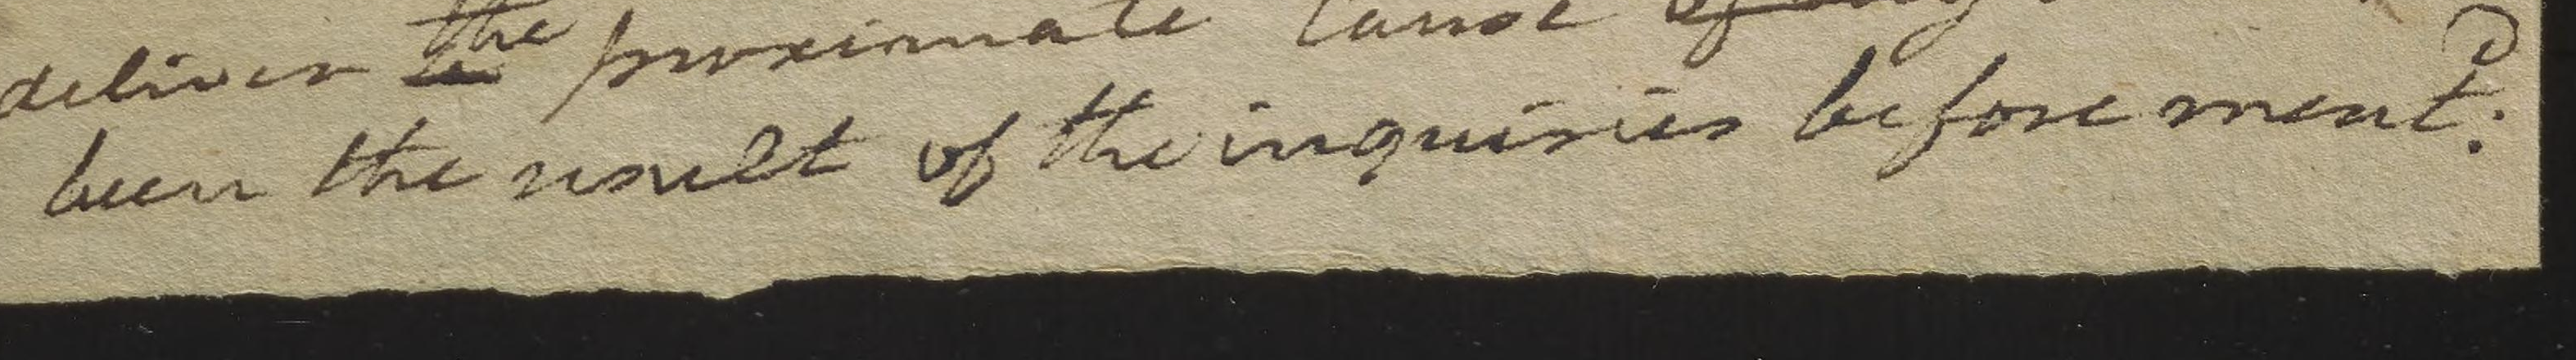been the subject of the inquiries before ment^d
